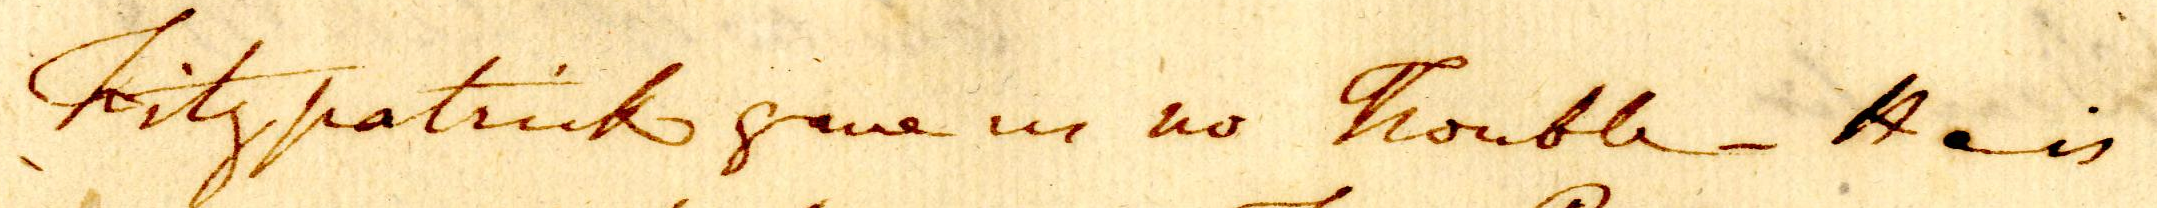Fitzpatrick gave us no Trouble. He is
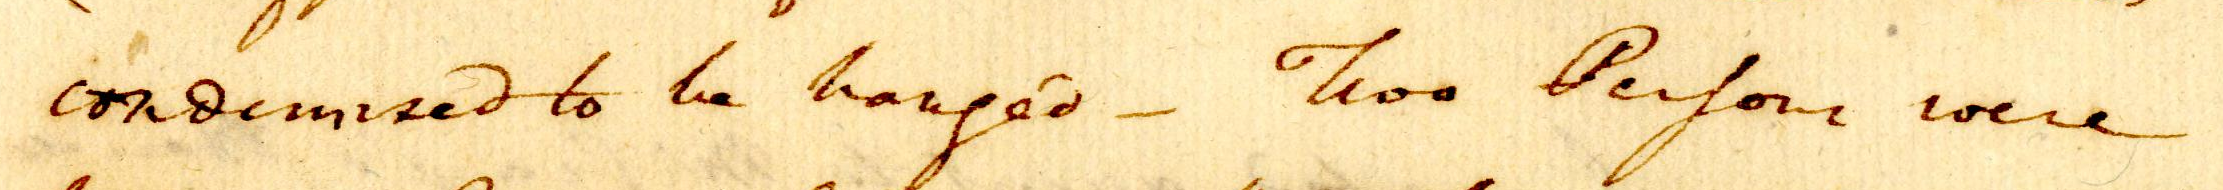condemned to be hanged- Two Persons were
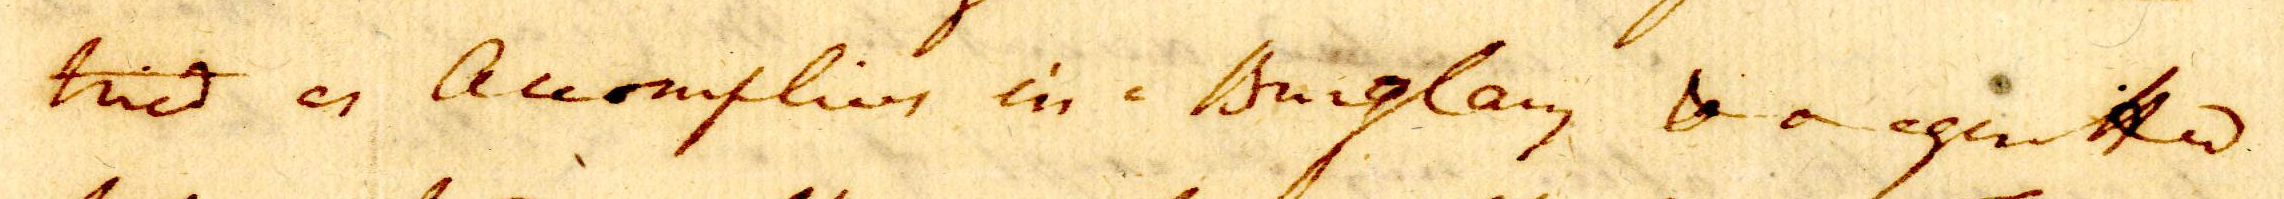tried as Accomplices in a Burglary & aquitted
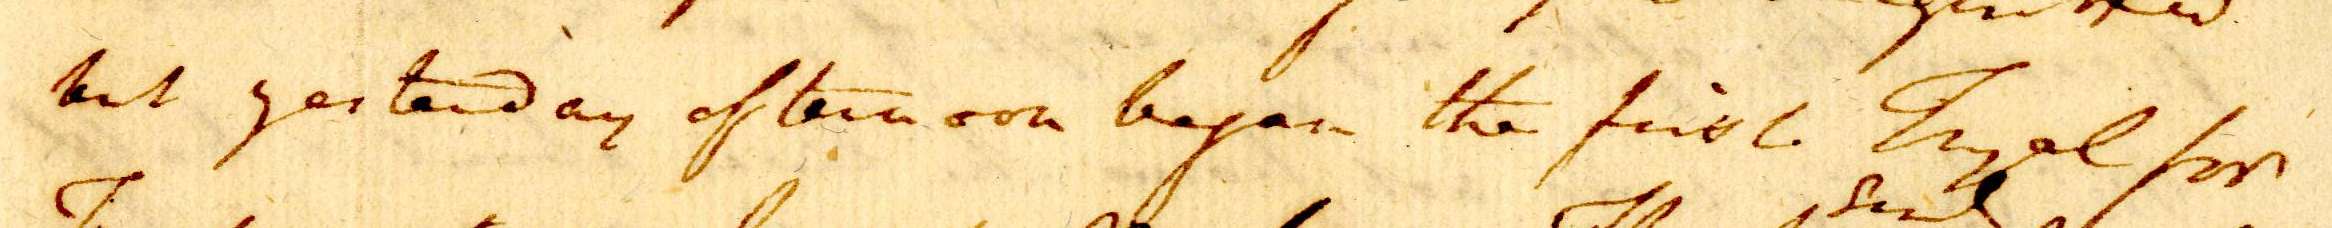but yesterday afternoon began the first Tryal for
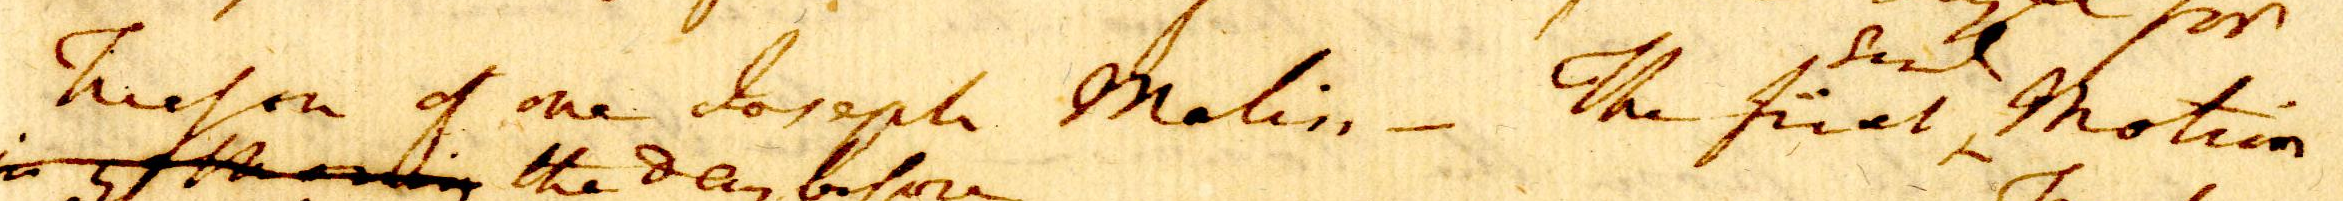Treason of one Joseph Malin. The first ^ Motion
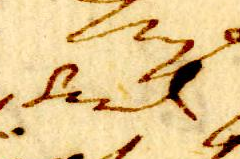genl
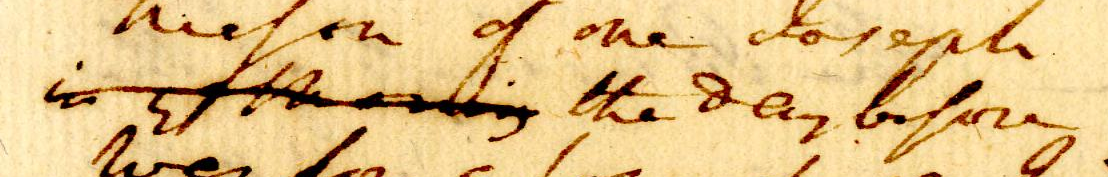in y^e Morning the day before
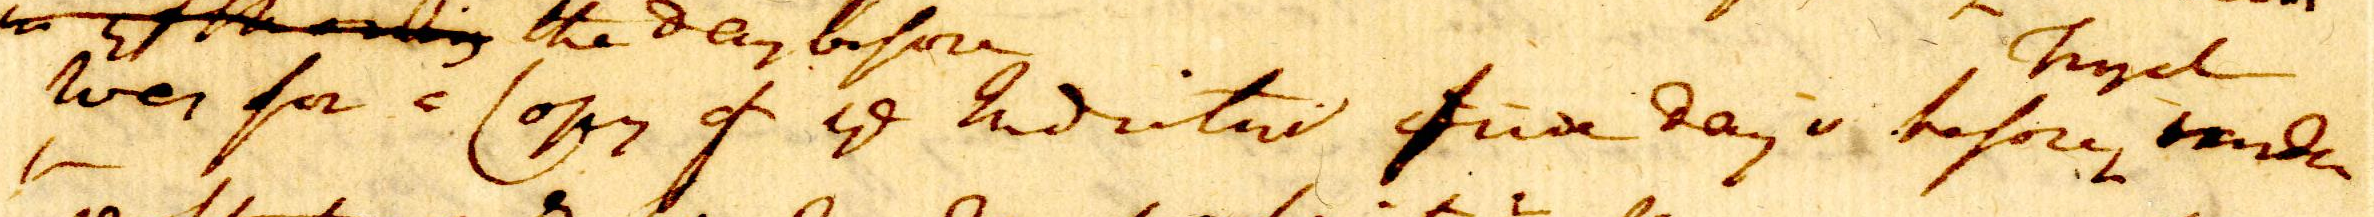was for a Copy of y^e Endritue five days before ^ under
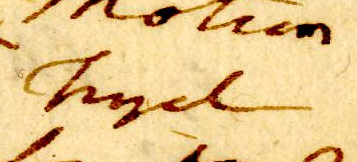Tryal
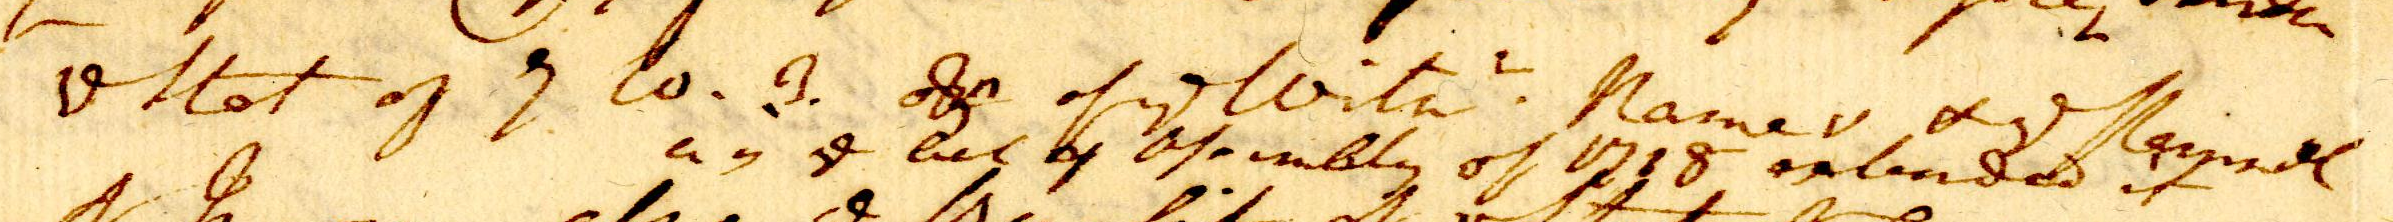& that of 7 Co. 3. &c of y^e Writin^g Names & y^e Manner
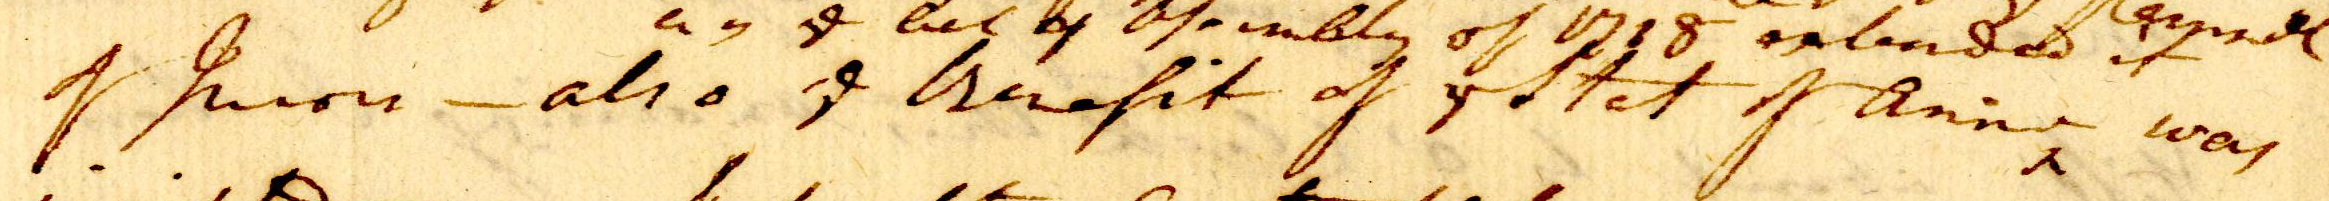of Jurors. also y^e Receipt of y^e Stat of Anne ^ was
